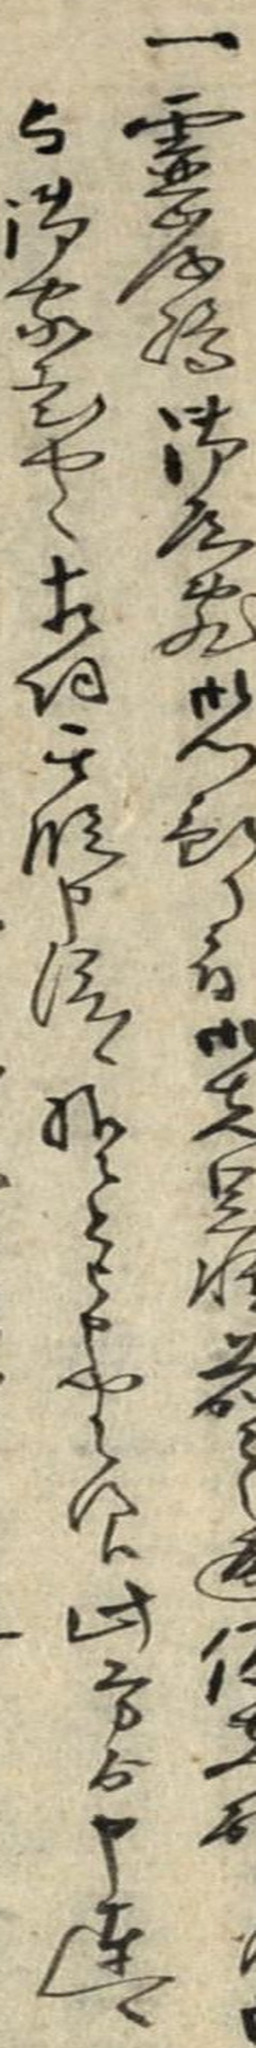と御家老中へ相伺其段申渡候様にと被申聞候得は此方ゟ申達候
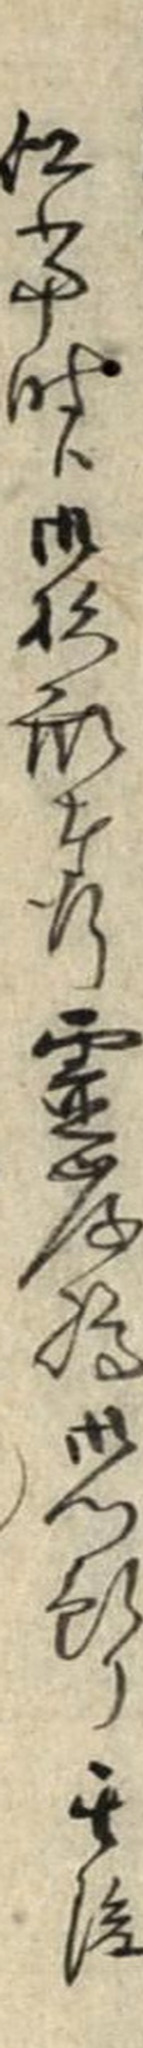但当時は御杉形奉行霊岸嶋御門預り其後
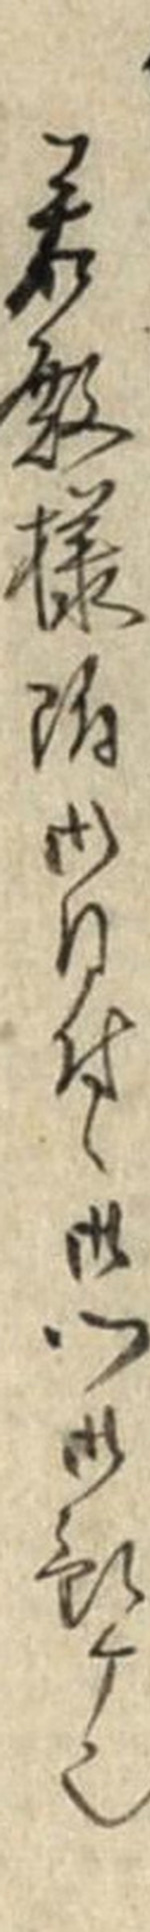若殿様附御目付へ御門預け也
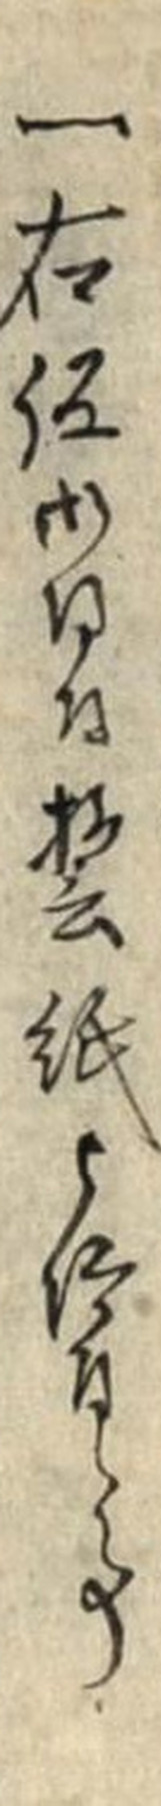一右仮御目付誓紙被仰付候事
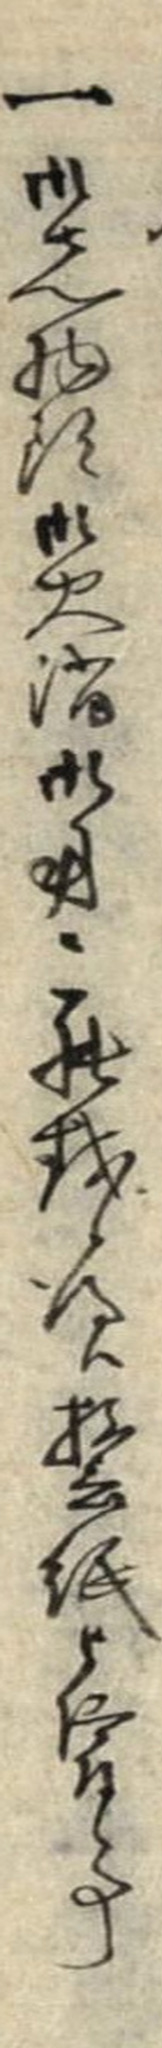一御先物頭御火消御用に罷越候得は誓紙被仰付候事
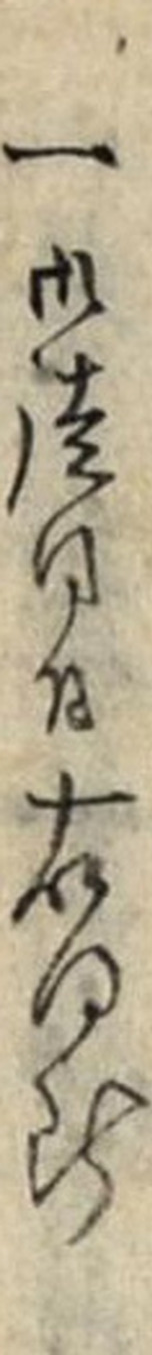一御徒目付右同断
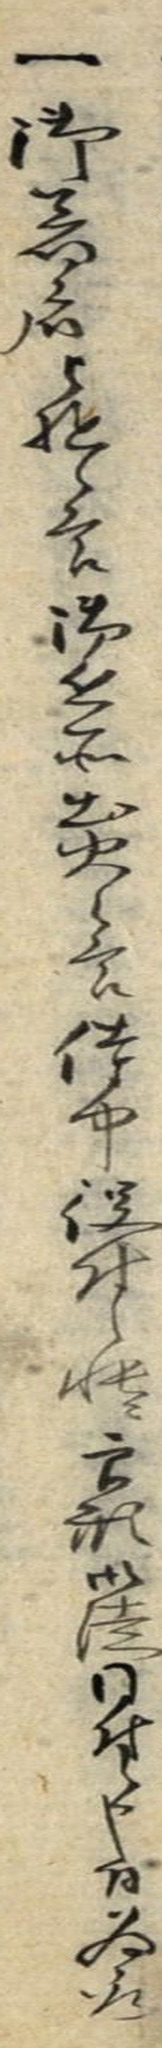一御着府被遊候節御近所出火之節侍中役付之帳に印形御徒目付へ申付為取

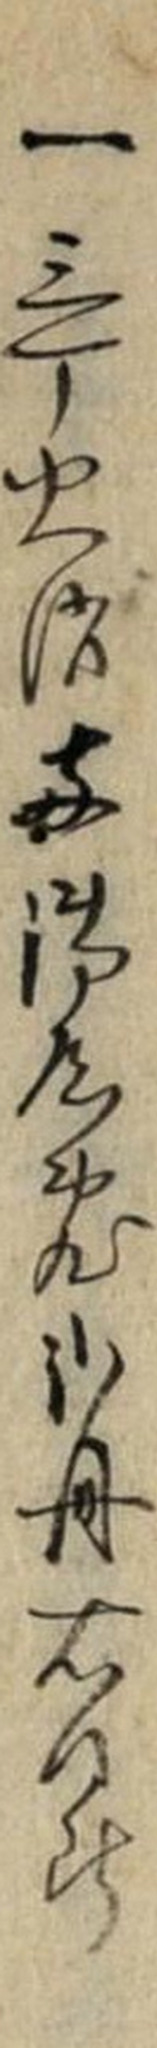一三丁火消両御屋敷弐冊右同断
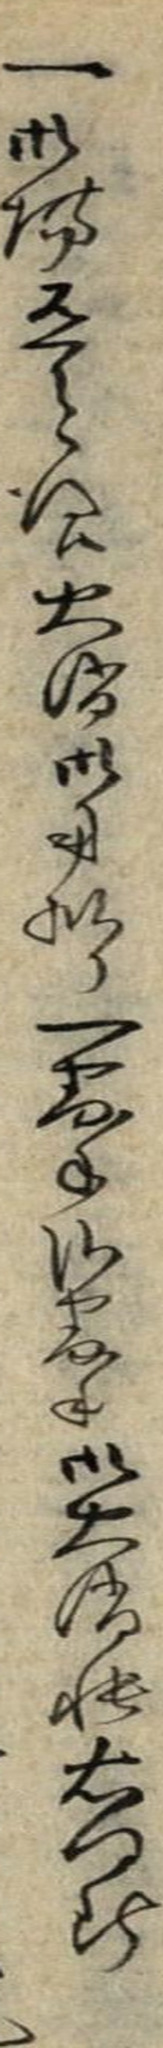一御場有之候得は火消御用掛り一番手弐番手御火消帳右同断
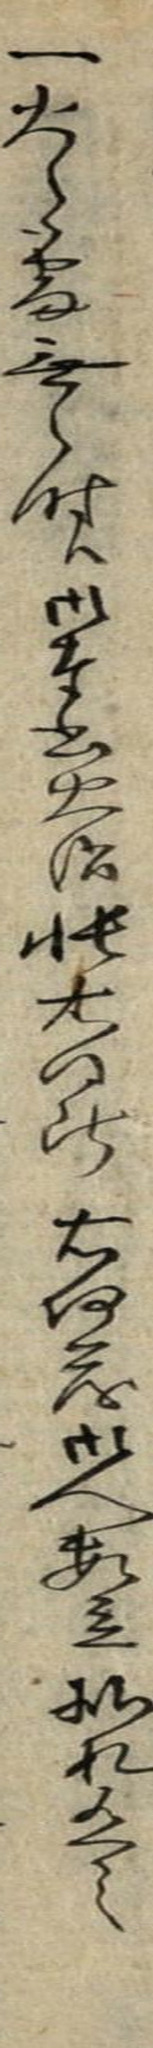一火之御番無之時は御奉書火消帳右同断右何も御人数立掛札有之
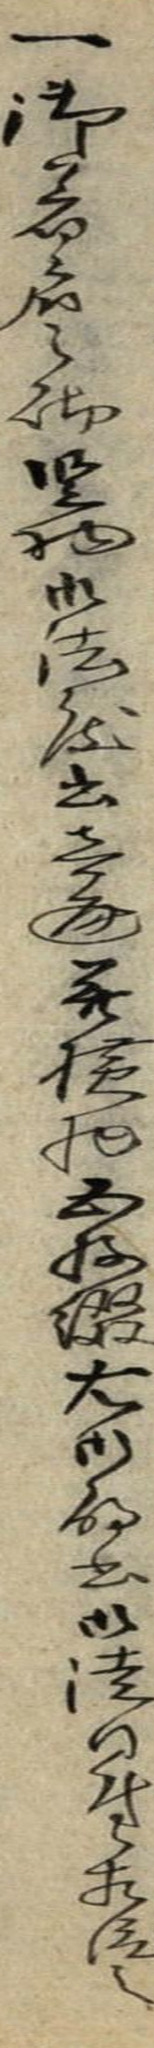一御着府之砌竪物御法度書壱通并横物五枚綴右御触書御徒目付へ相渡之
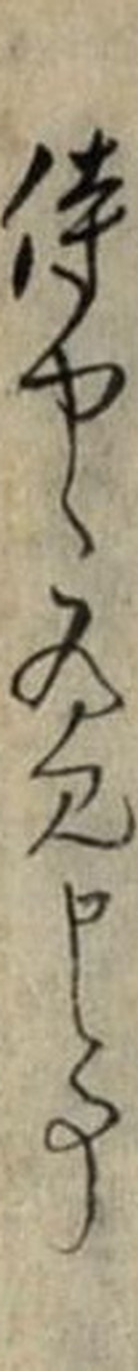侍中へ為見申事
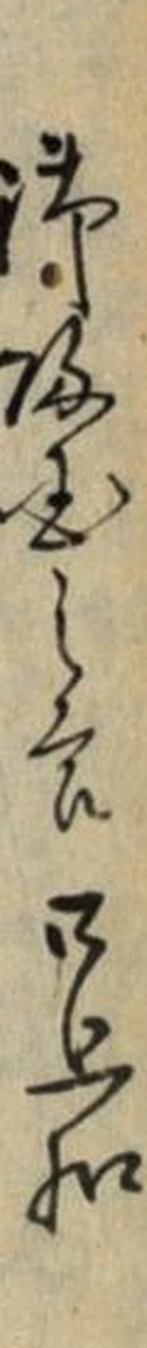御帰国之節口上扣
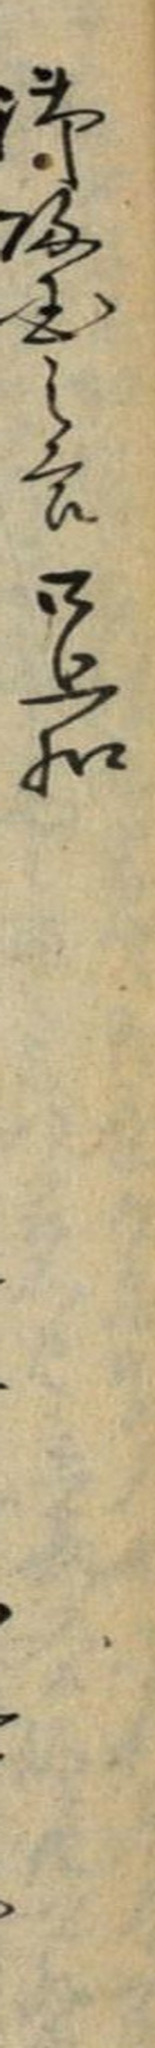御帰国之節口上扣
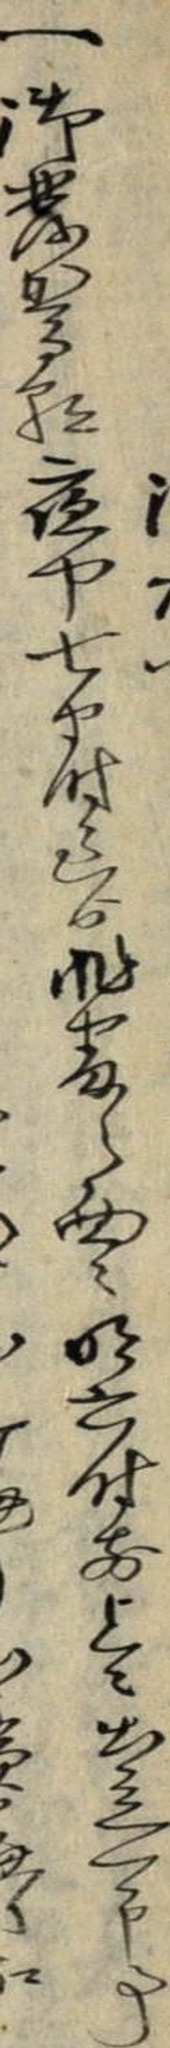一御発駕朝夜中七半時過ゟ非番之面々明六時前迄に出立可申事
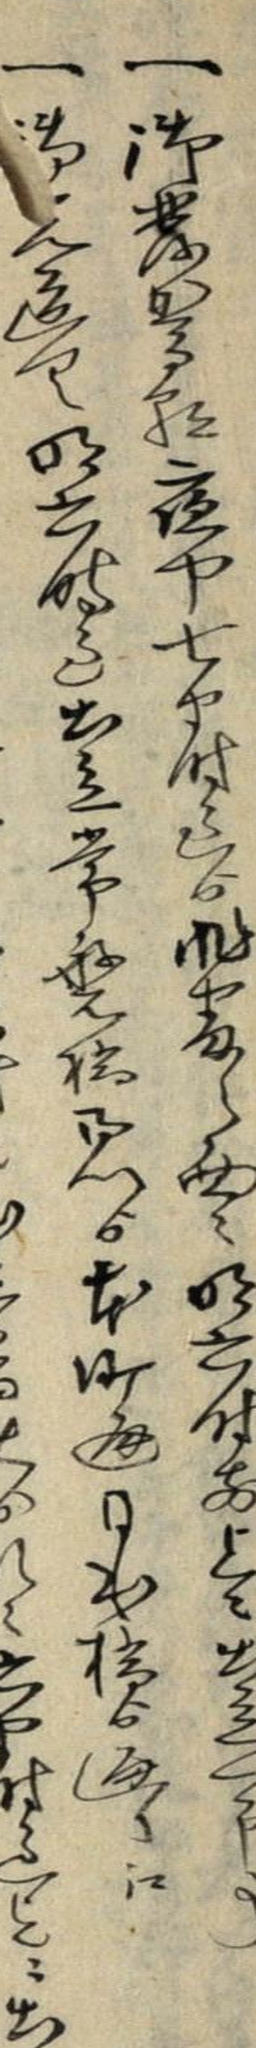一御先道具明六時過出立常盤橋御門ゟ本町通日本橋ゟ通り江
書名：三都并道中之部
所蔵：福井県文書館 Fukui Prefectural Archives
